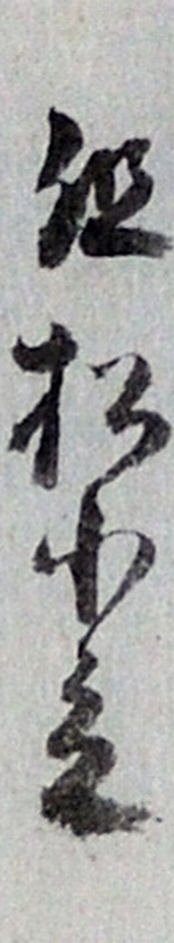但松小立
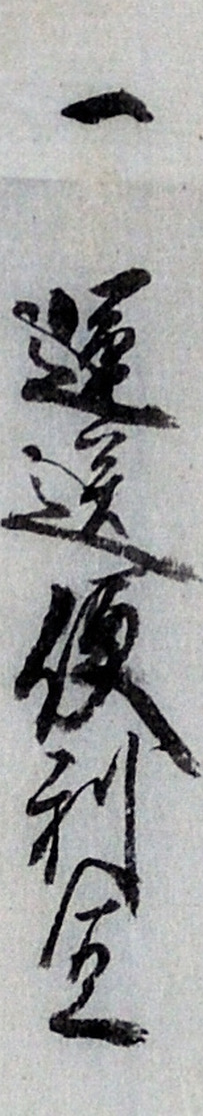一運送便利宜

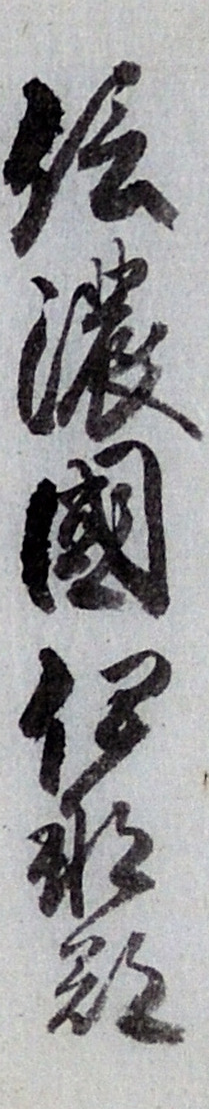信濃国伊那郡
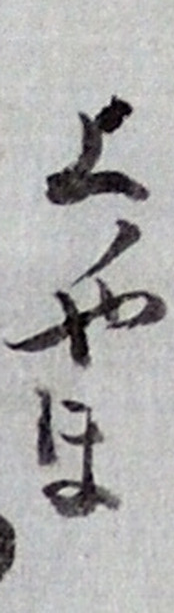上ノやま
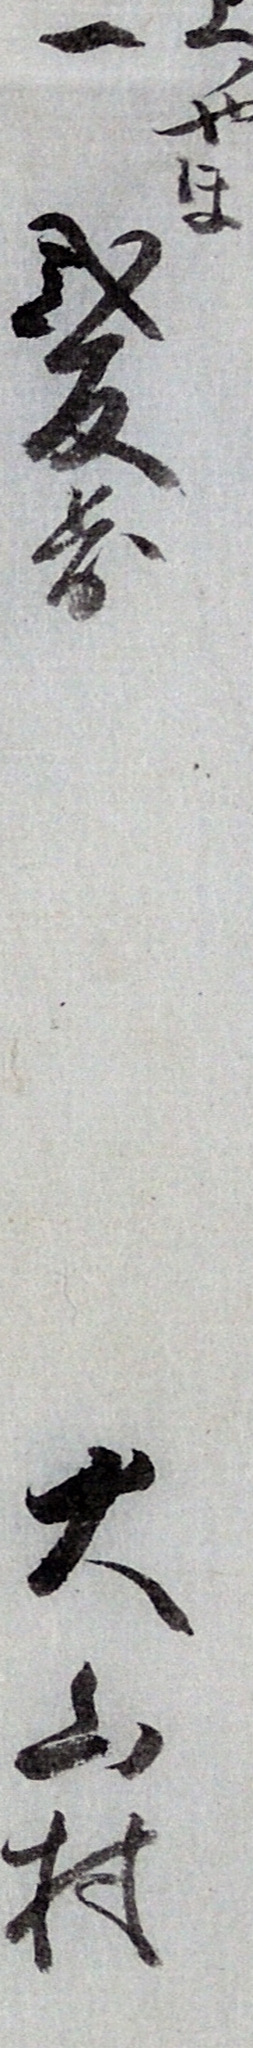一壱反歩火山村
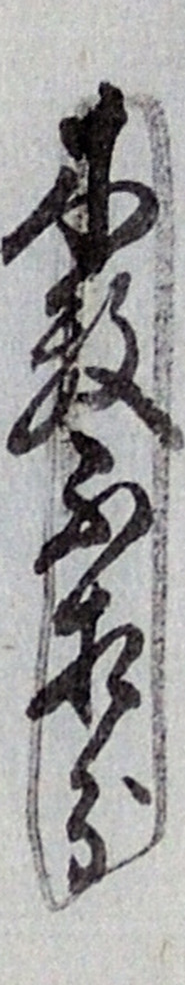木数不相分
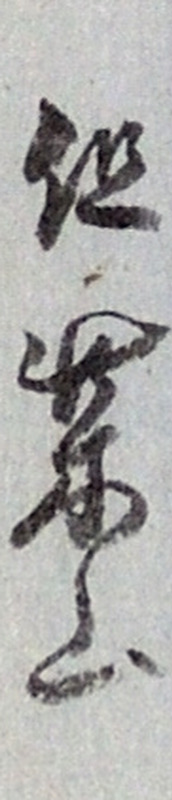但芝山
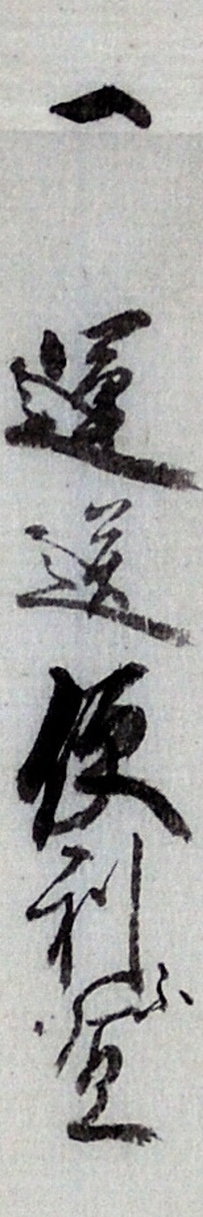一運送便利不宜
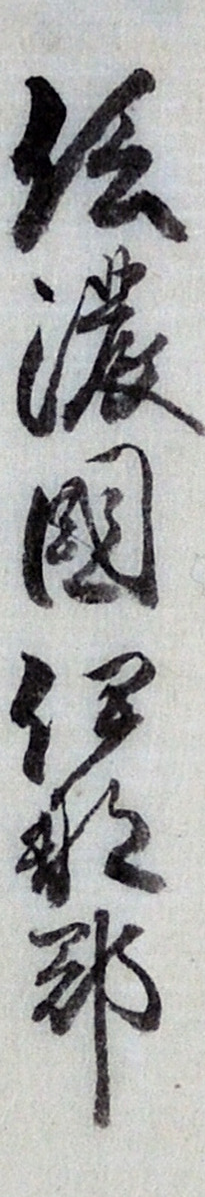信濃国伊那郡
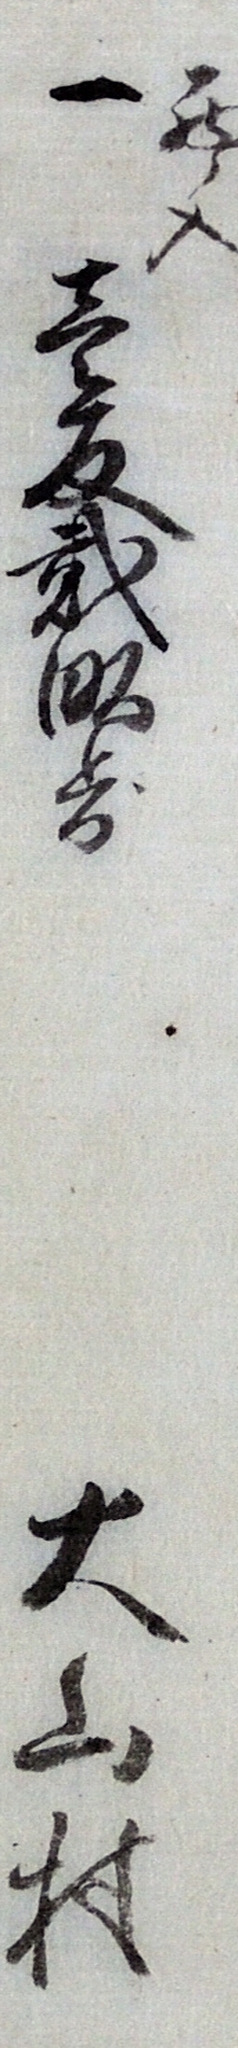一壱反弐㽗歩火山村
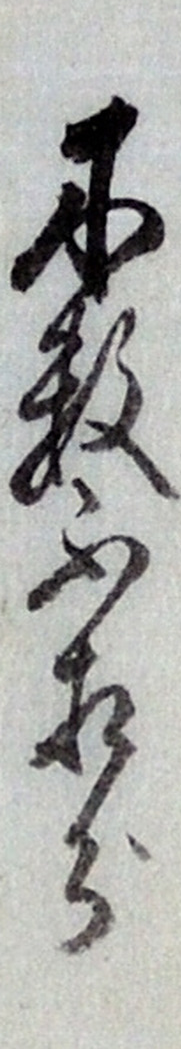木数不相分
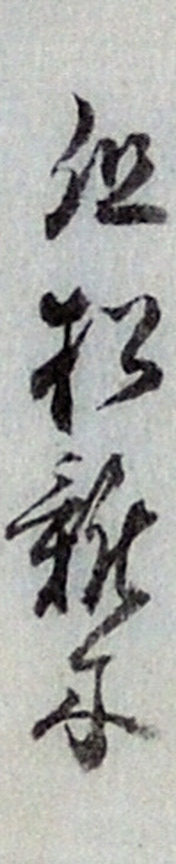但松雑木
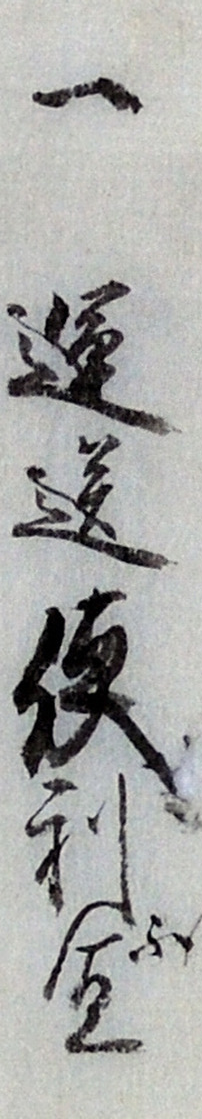一運送便利不宜
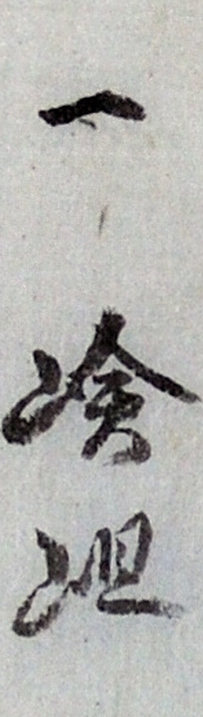一嶮岨

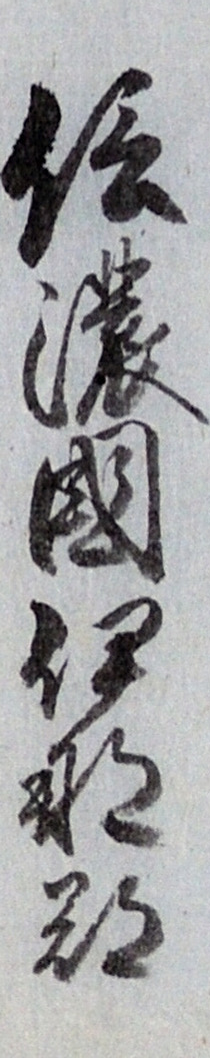信濃国伊那郡
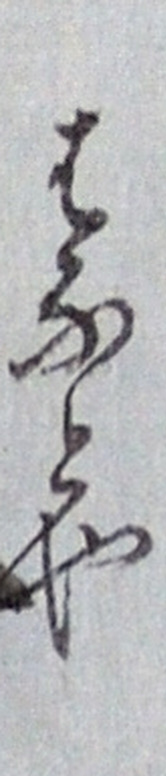はふとや
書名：官林反別帳
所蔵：伊那市立高遠町図書館・合同会社AMANE
